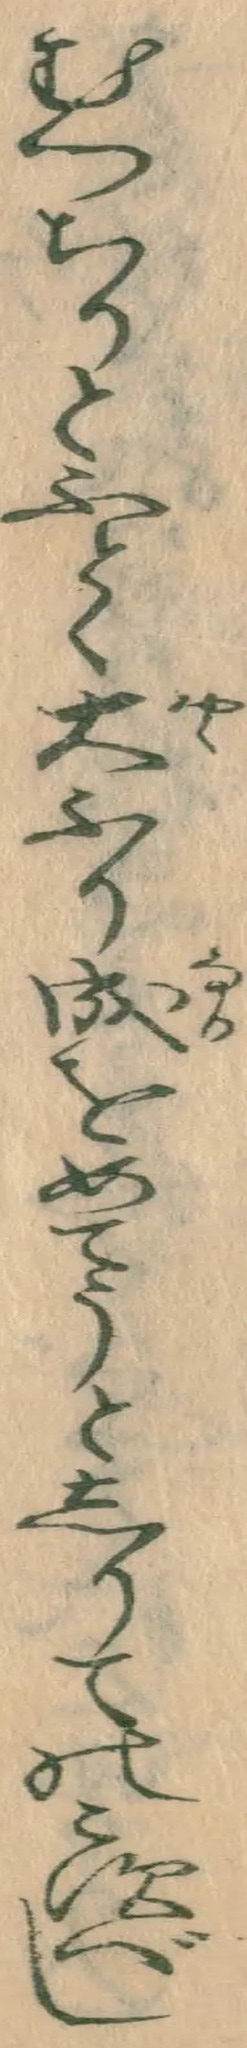むつちりとふとく大ふり成をめてうとしりてのこすべし
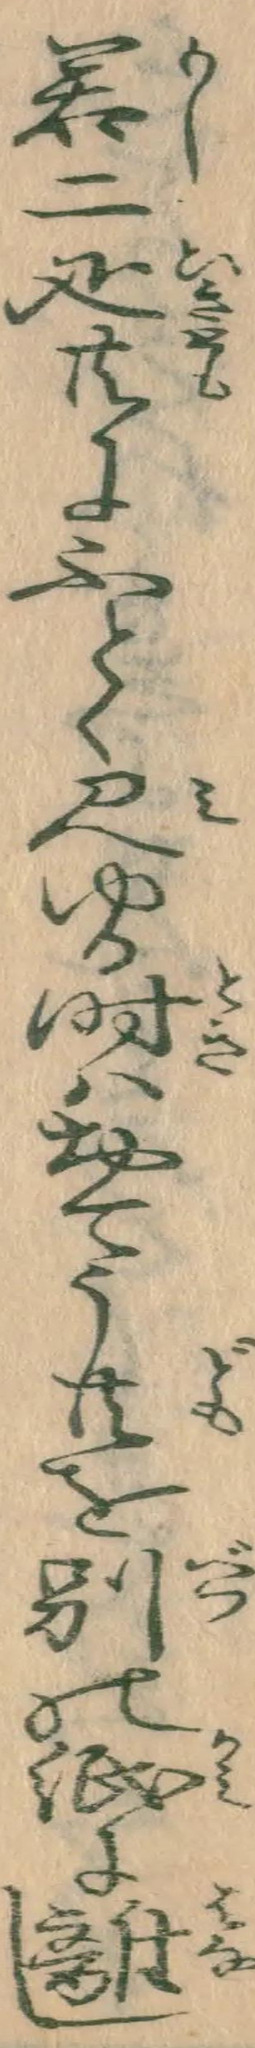若二疋共にふとく見ゆる時はおてう共を別の紙に離し
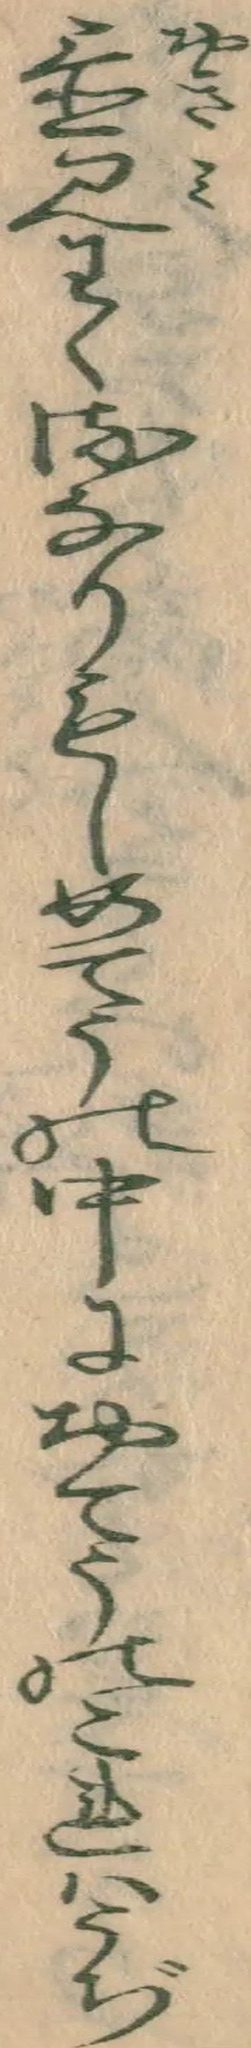置見わくるなりもしめてうの中におてうのこれはうぢ
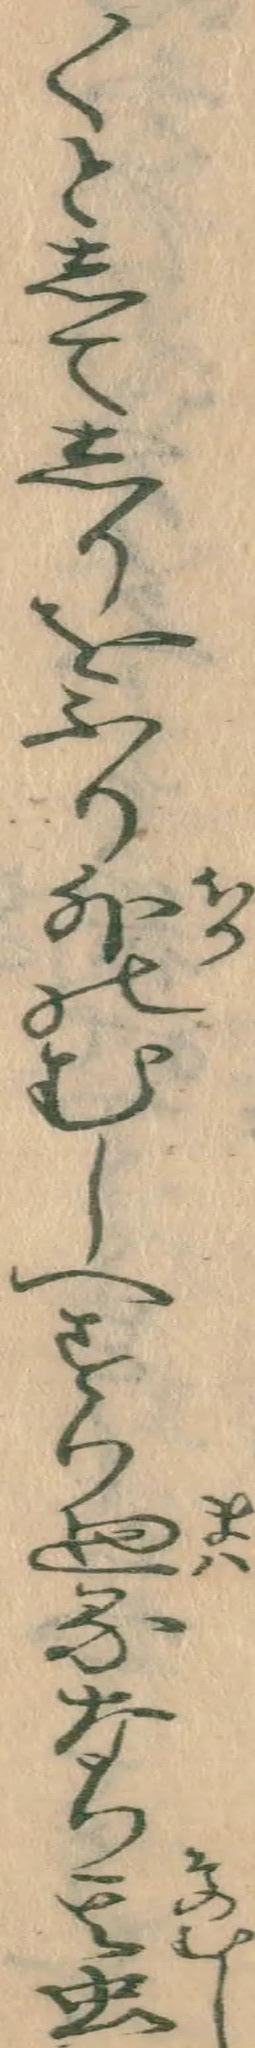〳〵としてしりをふり外のむしへすり廻るなり其虫
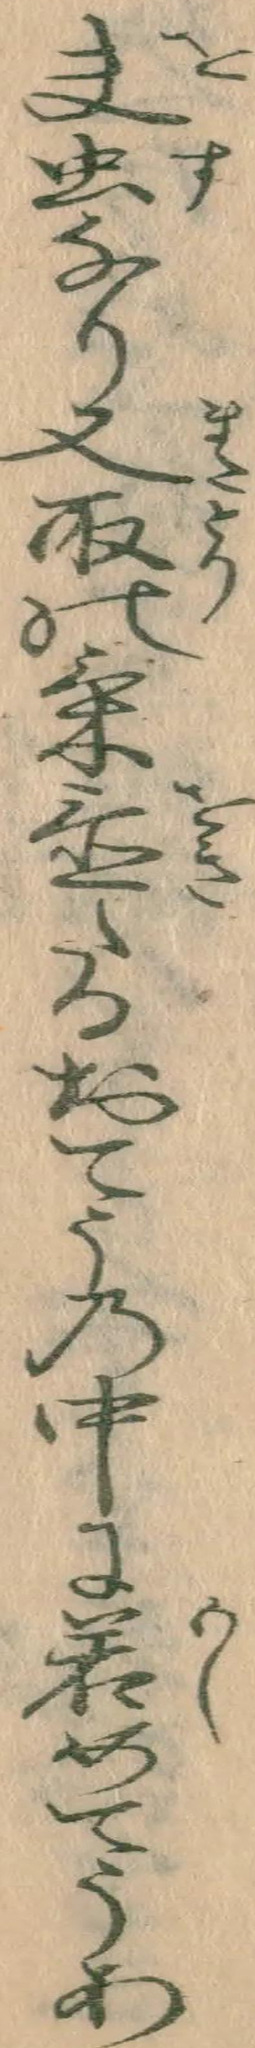夫虫なり又取のけ置たるおてうの中に若めてうあ
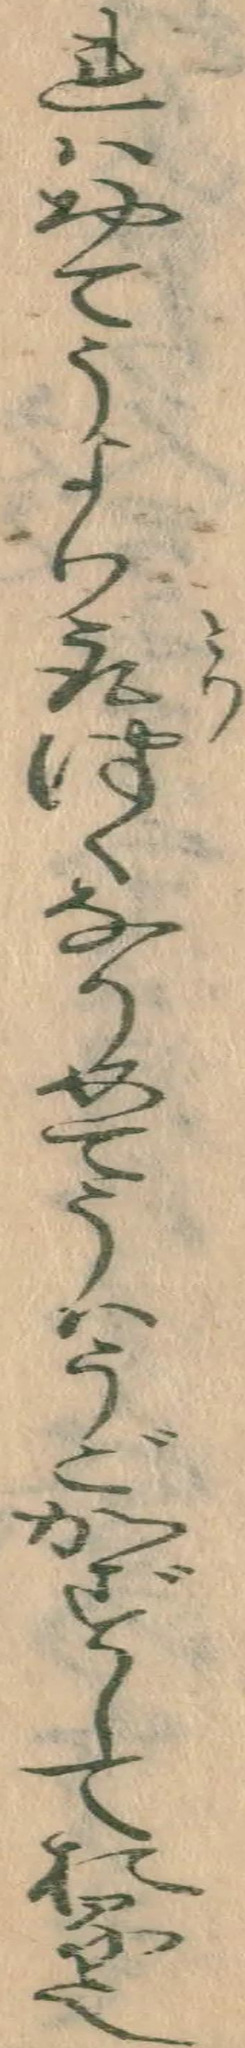れはおてうより取つくなりめてうはうごかずしておる也
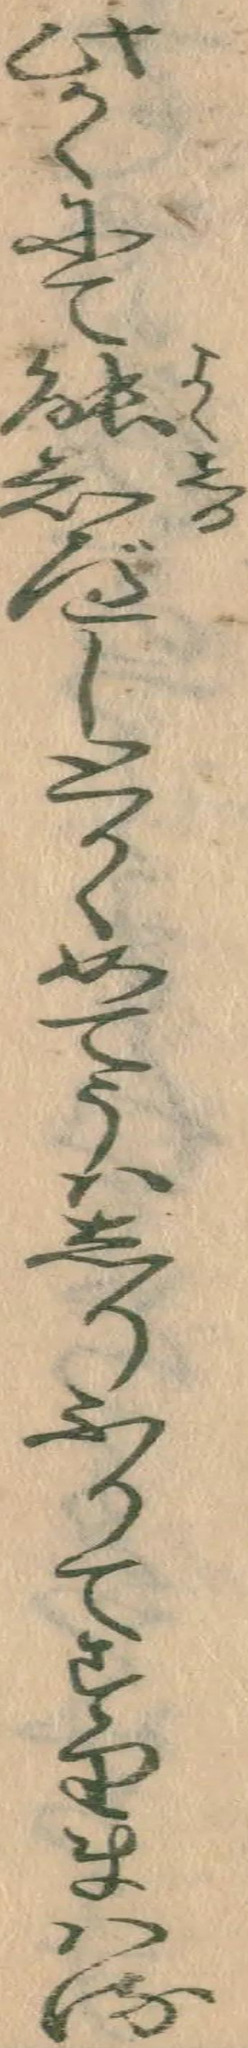此かくにて能知べしとかくめてうはしりふりてすりまはる
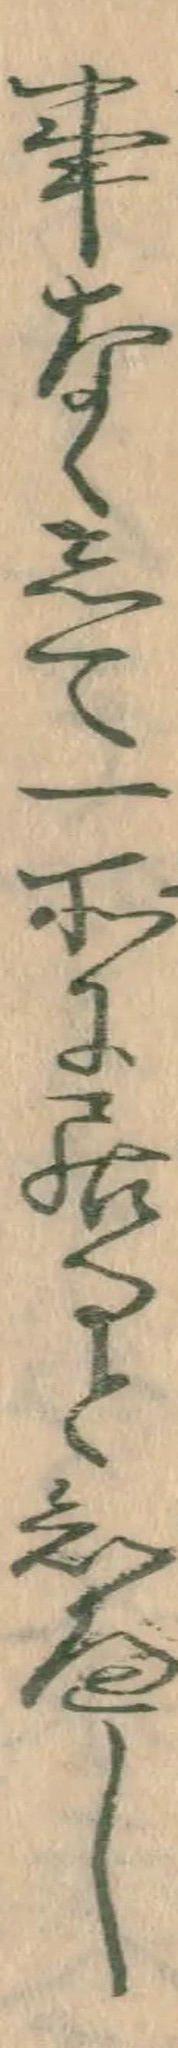事なくして一所に居ると知べし
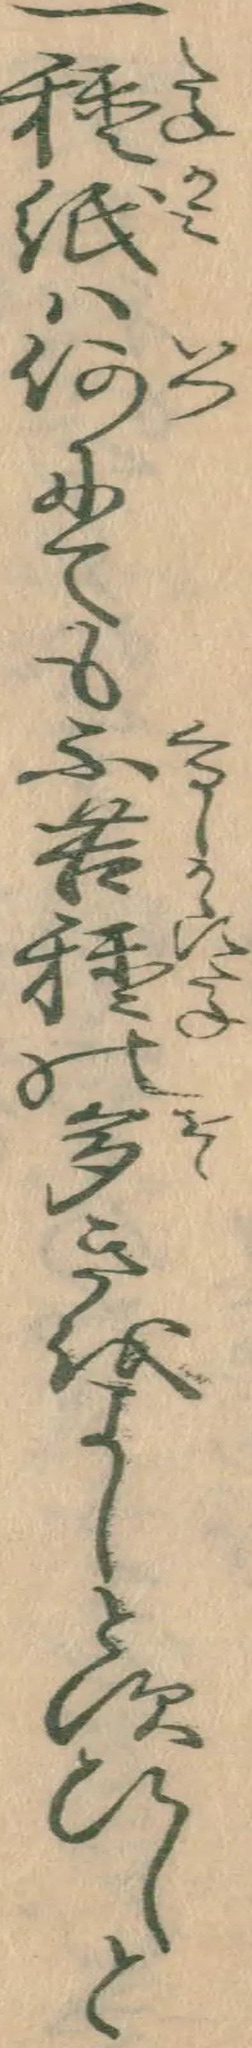一種紙は何にても不苦種の多きをよしとすひしと
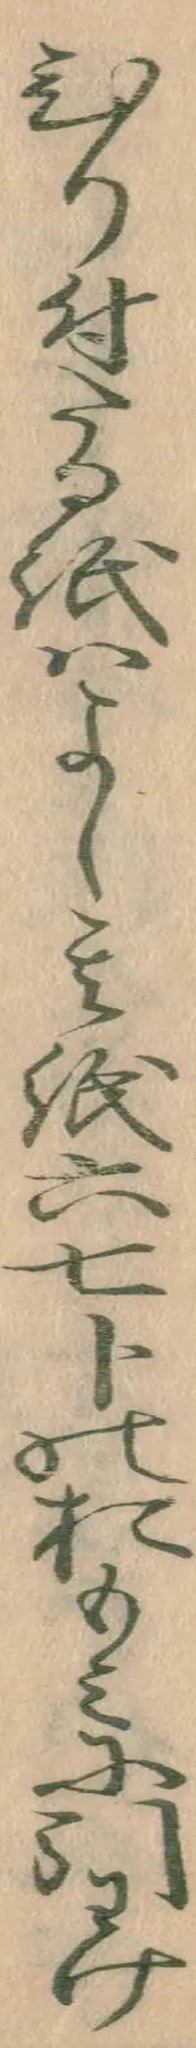ひり付たる紙はよし其紙六七分のおもみに引わけ
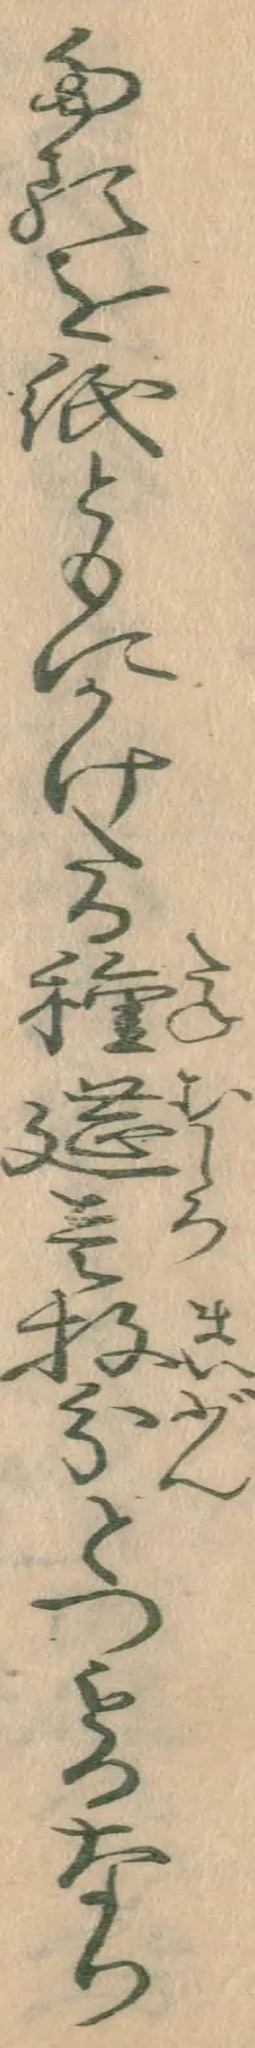たるを紙ともにかけたる種莚壱枚分とつもるなり
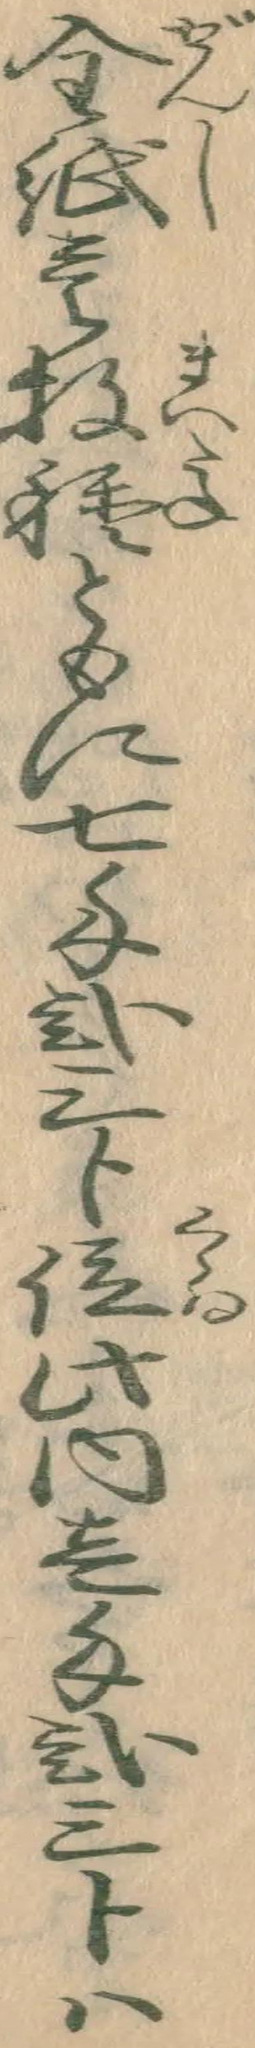全紙壱枚種ともに七匁弐三分位此内壱匁弐三分は
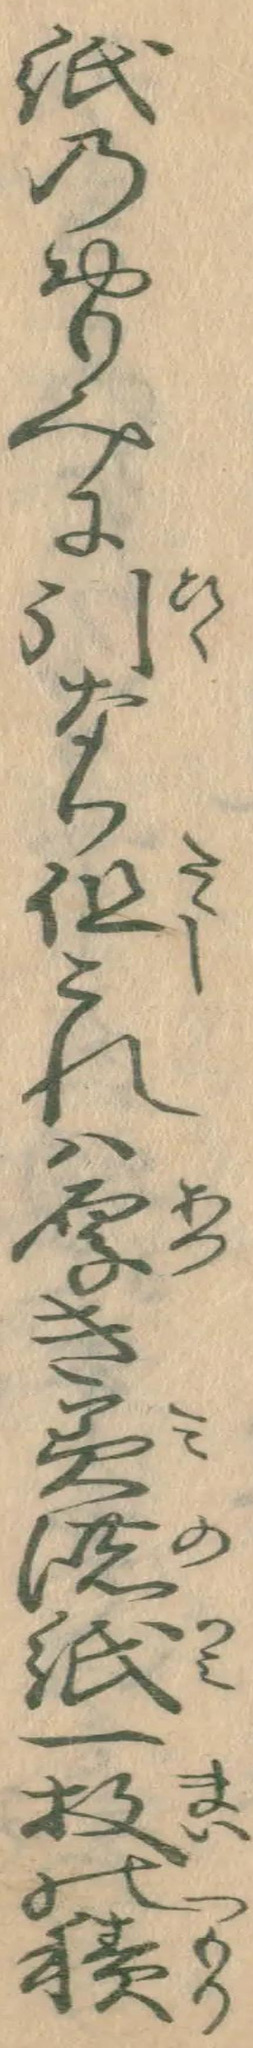紙のおもみに引なり但これは厚き美濃紙一枚の積
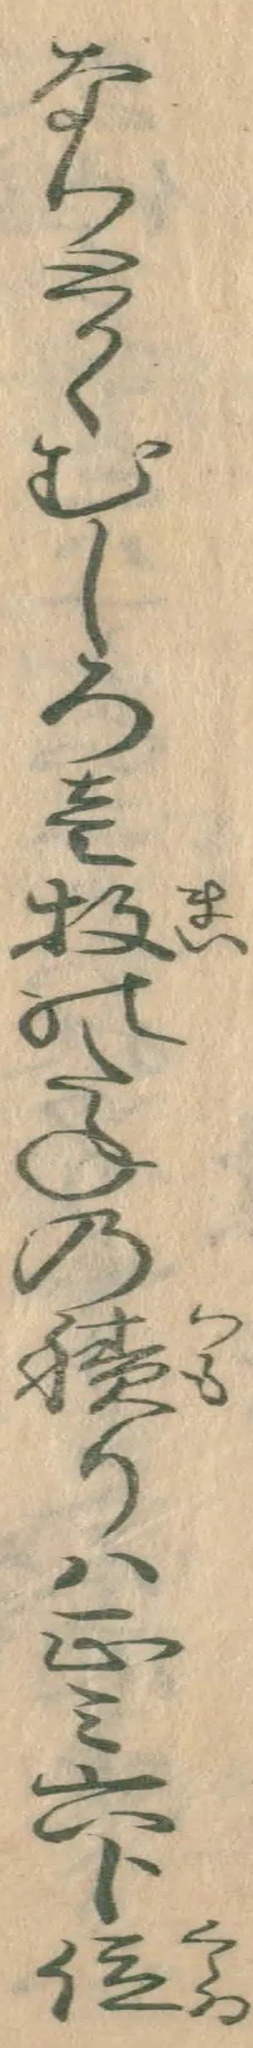なりとかくむしろ壱枚のたねの積りは正み六分位
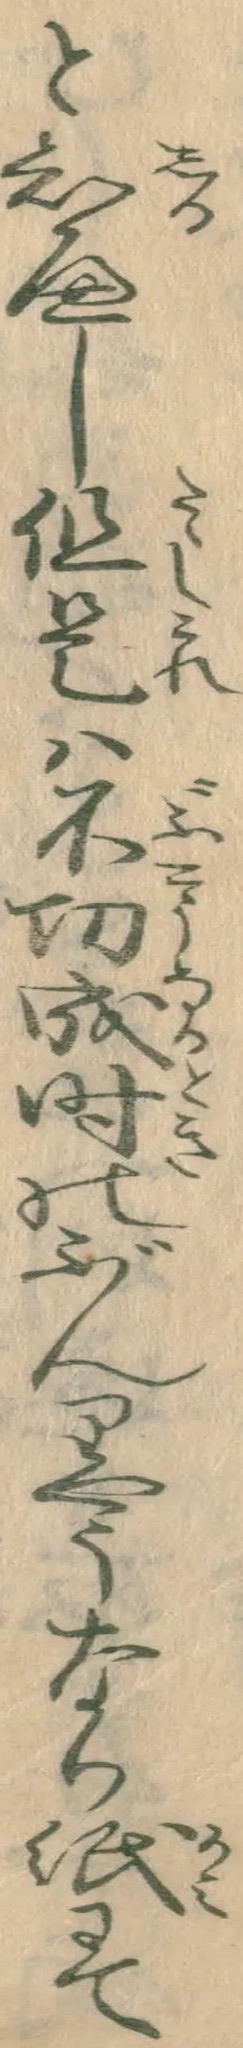と知へし但是は不功成時のぶんりやうなり紙にて
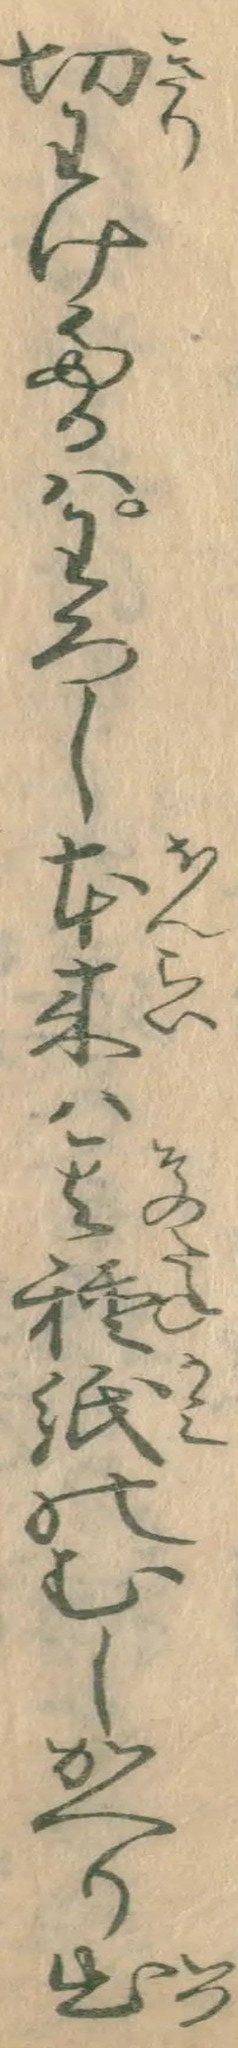切わけたるは。わろし本来は其種紙のむしかへり出
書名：蚕飼養法記
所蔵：国立国会図書館 National Diet Library, JAPAN
